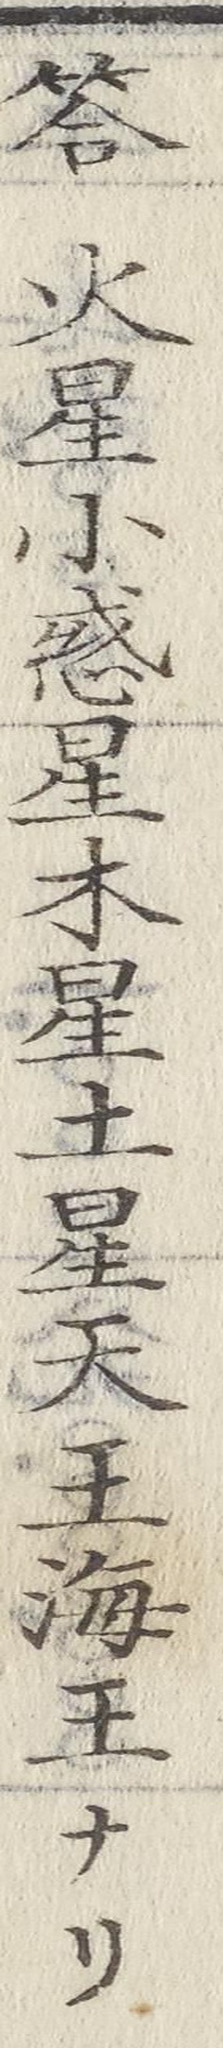答火星小惑星木星土星天王海王ナリ

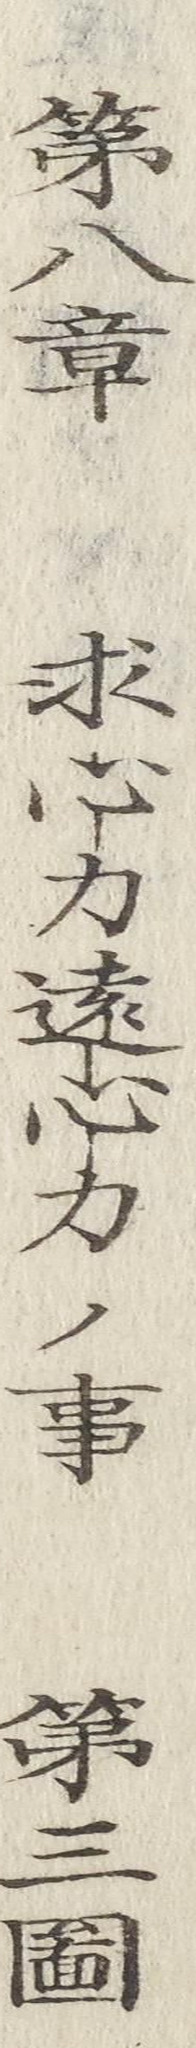第八章求心力遠心力ノ事第三図
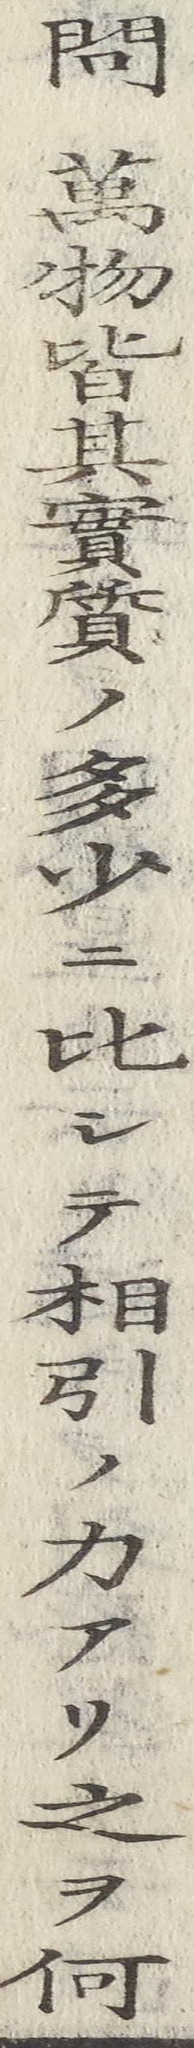問万物皆其実質ノ多少ニ比シテ相引ノ力アリ之ヲ何
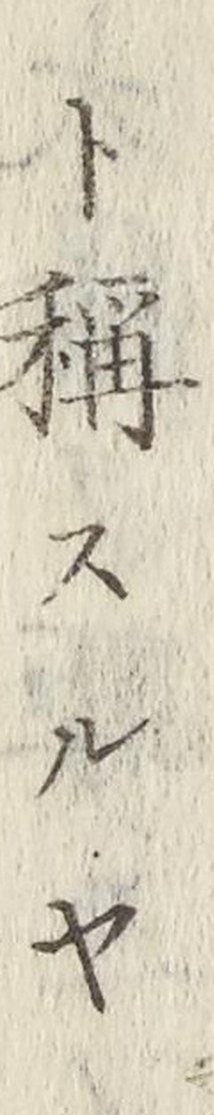ト称スルヤ
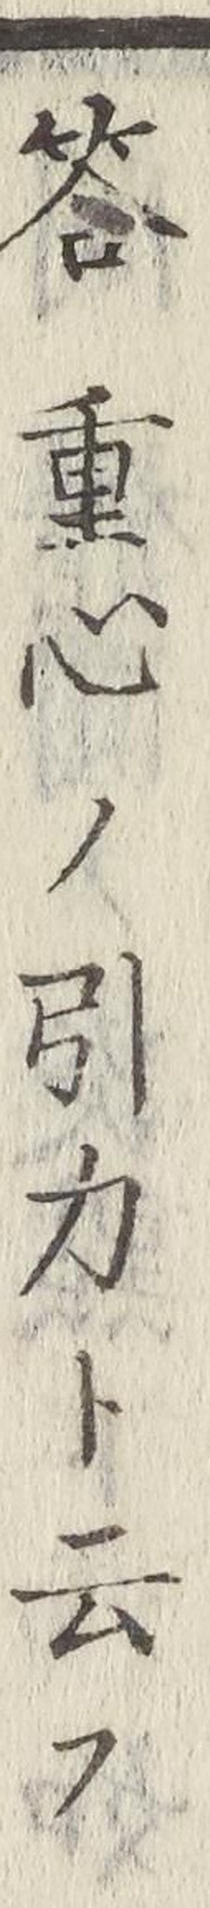答重心ノ引力ト云フ
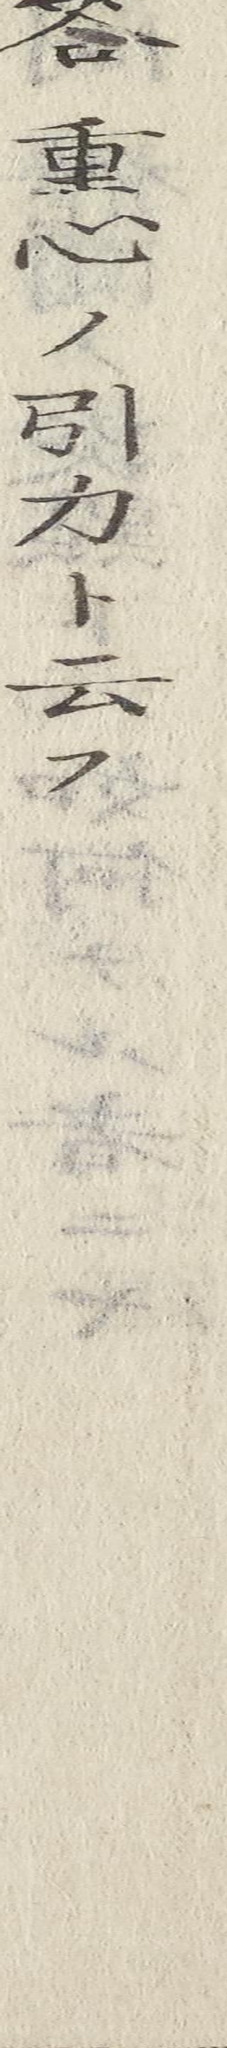答重心ノ引力ト云フ
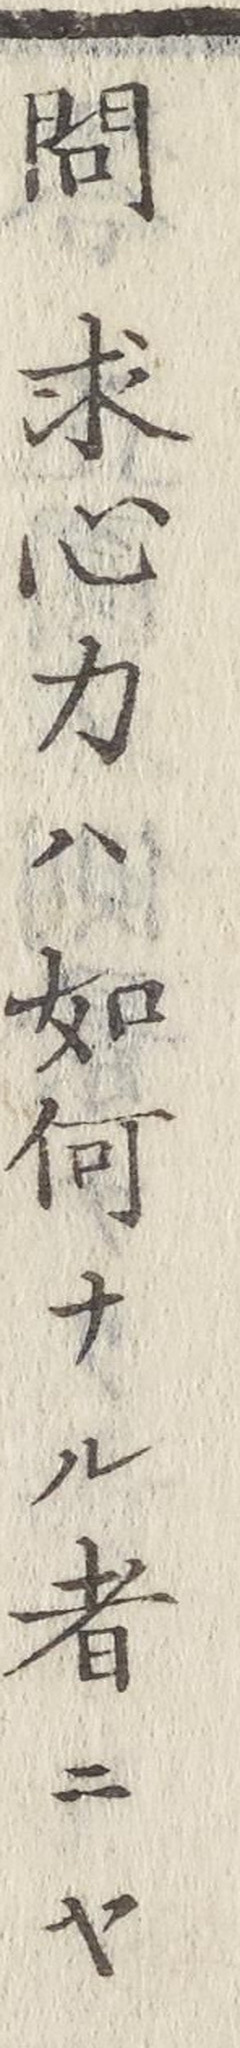問求心力ハ如何ナル者ニヤ
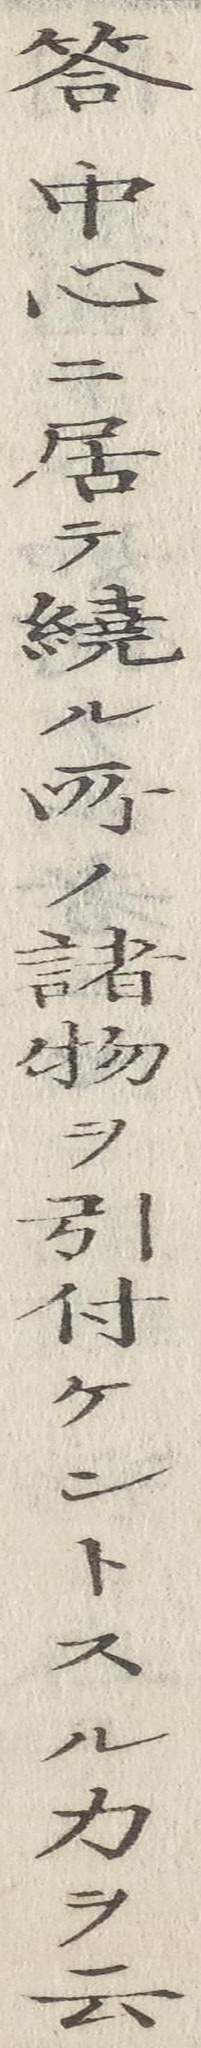答中心ニ居テ繞ル所ノ諸物ヲ引付ケントスル力を云
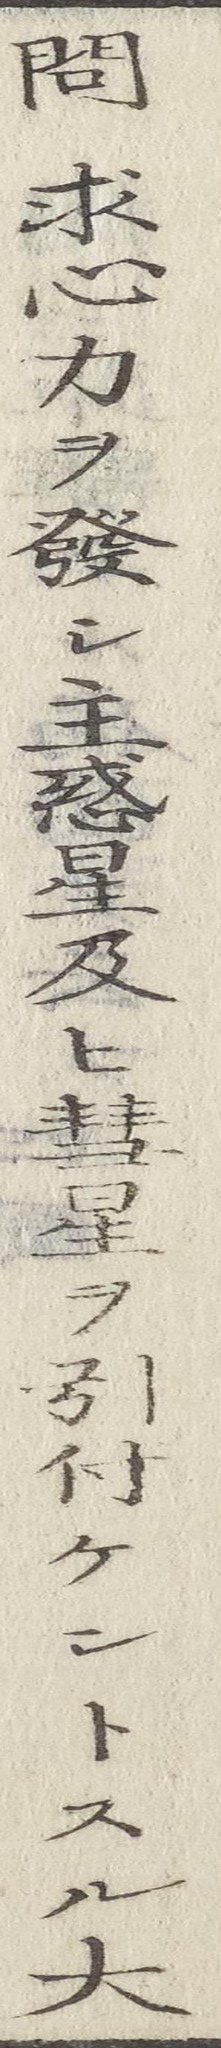問求心力を発シ主惑星及ヒ彗星ヲ引付ケントスル大
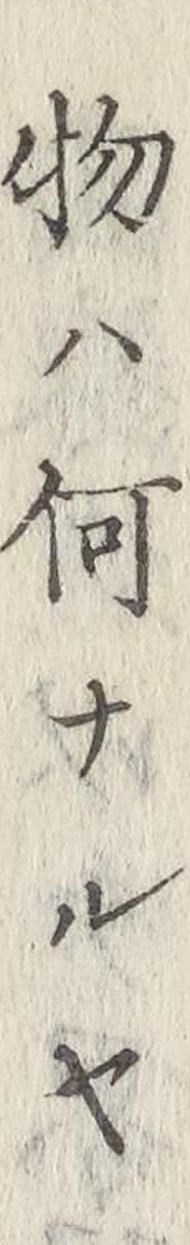物ハ何ナルヤ
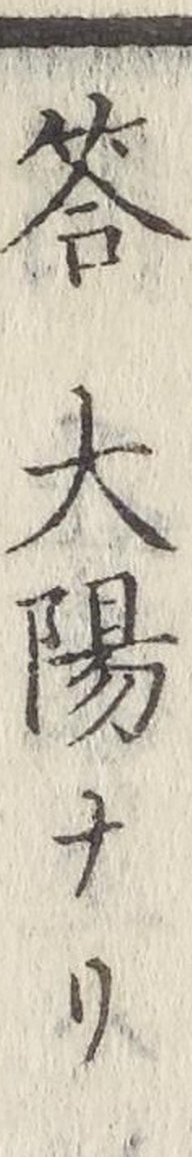答大陽ナリ
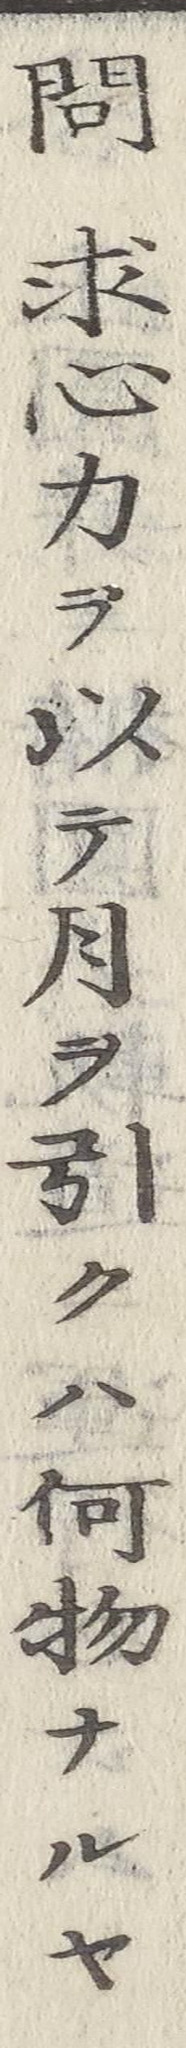問求心力ヲ以テ月ヲ引クハ何物ナルヤ
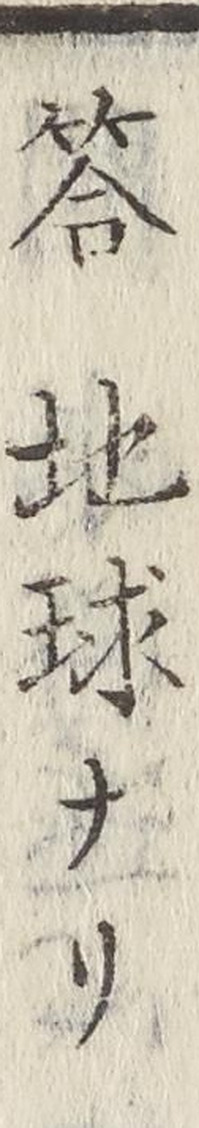答地球ナリ
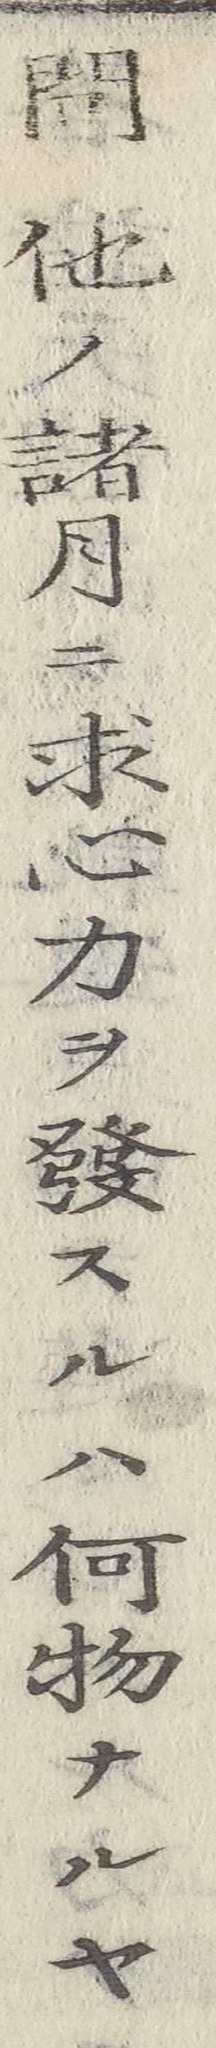問他ノ諸月ニ求心力ヲ発スルハ何物ナルヤ
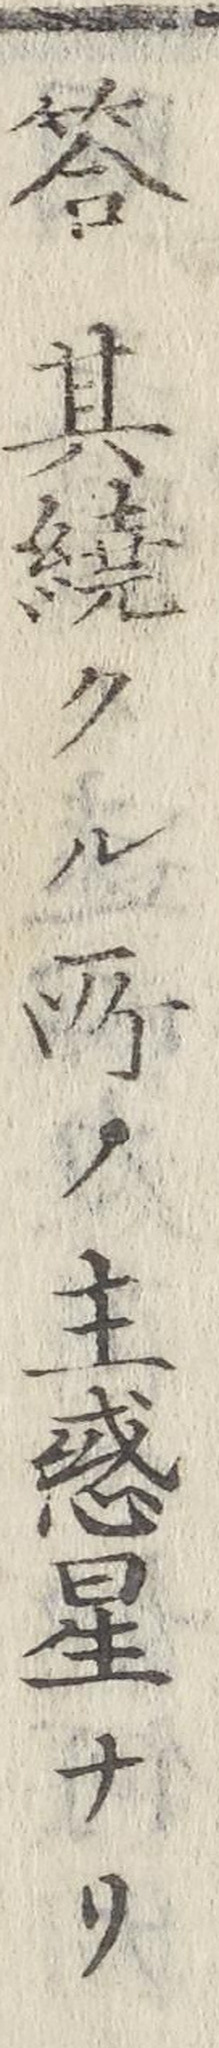答其繞クル所ノ主惑星ナリ

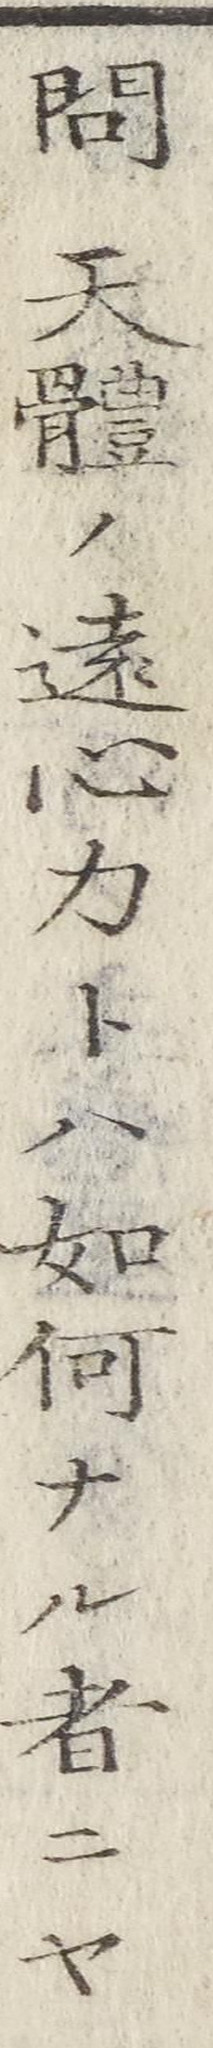問天体ノ遠心力トハ如何ナル者ニヤ
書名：星学圖説　上
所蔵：東京大学地震研究所図書室 Earthquake Research Institute Library, The University of Tokyo, JAPAN
